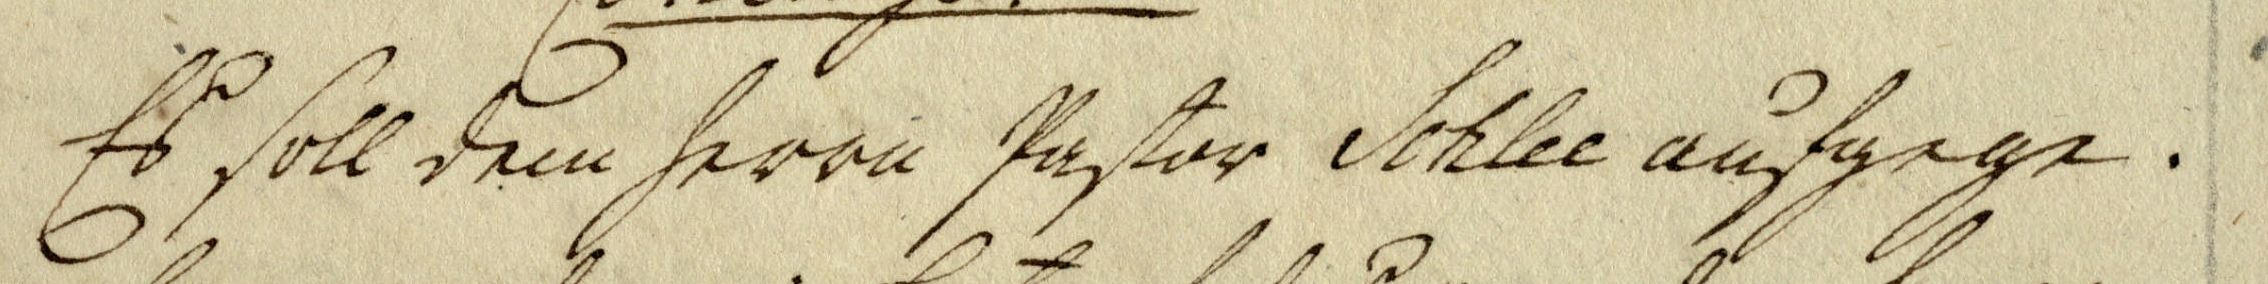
Es soll dem Herrn Pastor Schlee aufgege¬
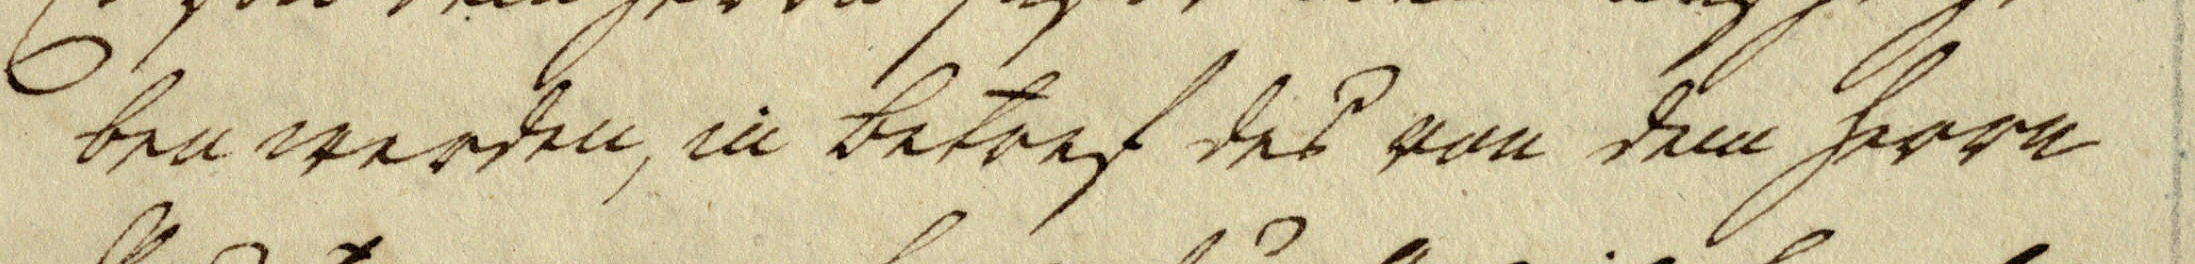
ben werden, in Betref des von dem Herrn
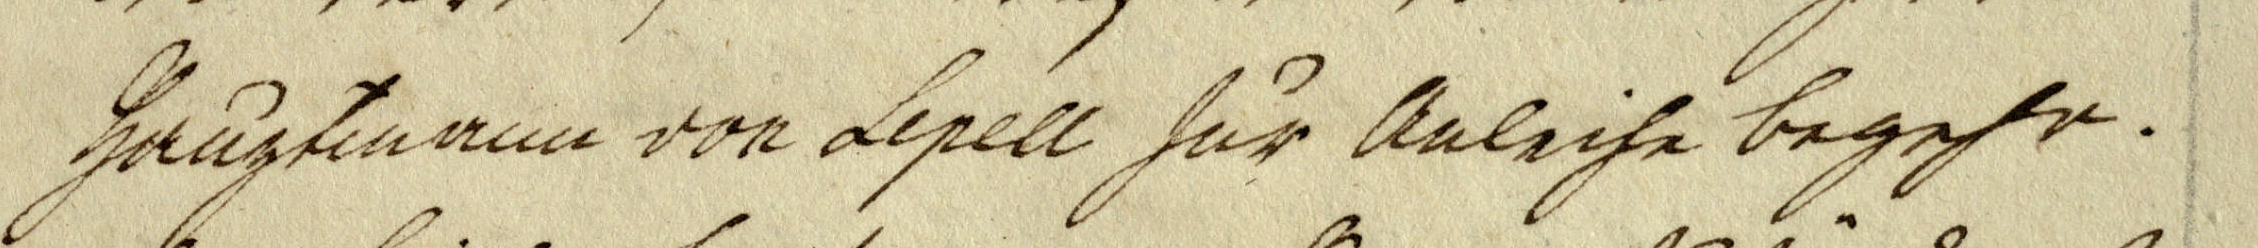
Hauptmann von Lepell zur Anleihe begehr¬
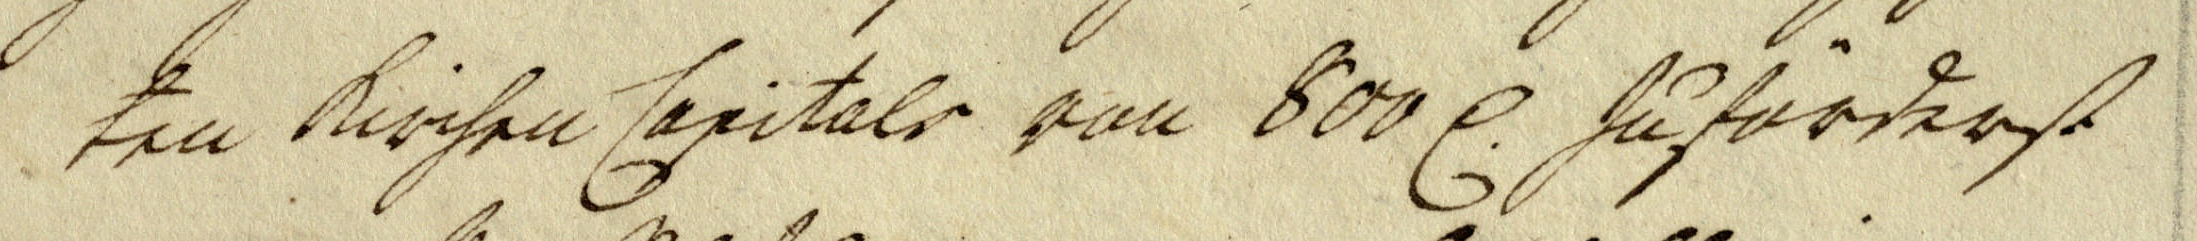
ten Kirchen Capitals von 800 l. zuförderst
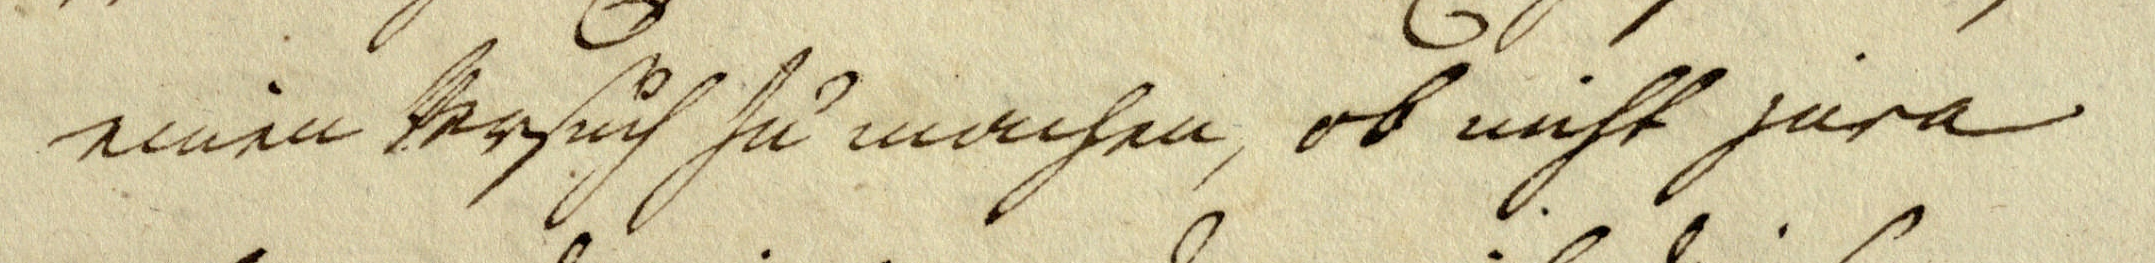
einen Versuch zu machen, ob nicht jura
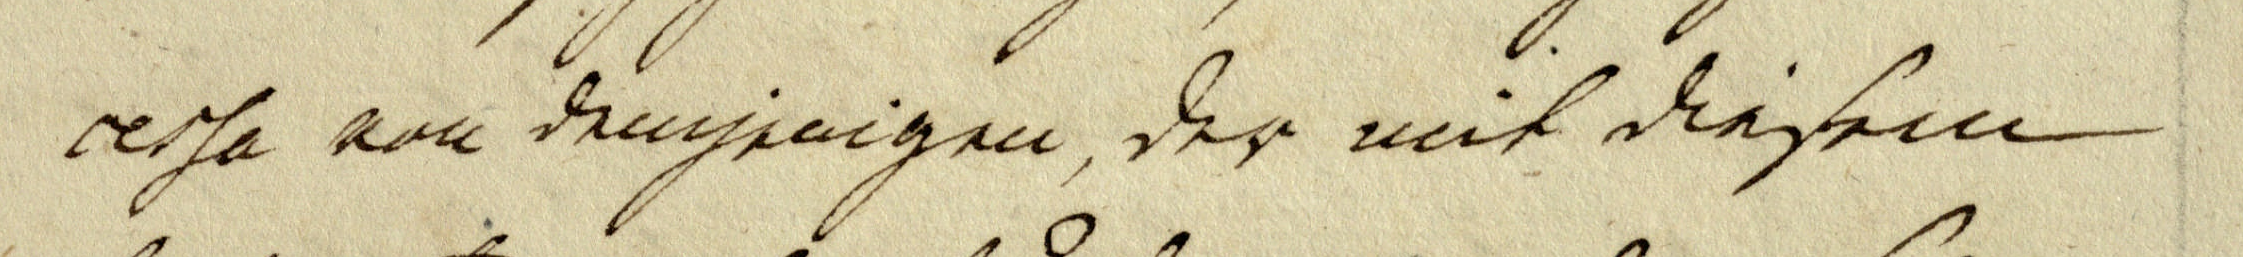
cessa von demjenigen, der mit diesem
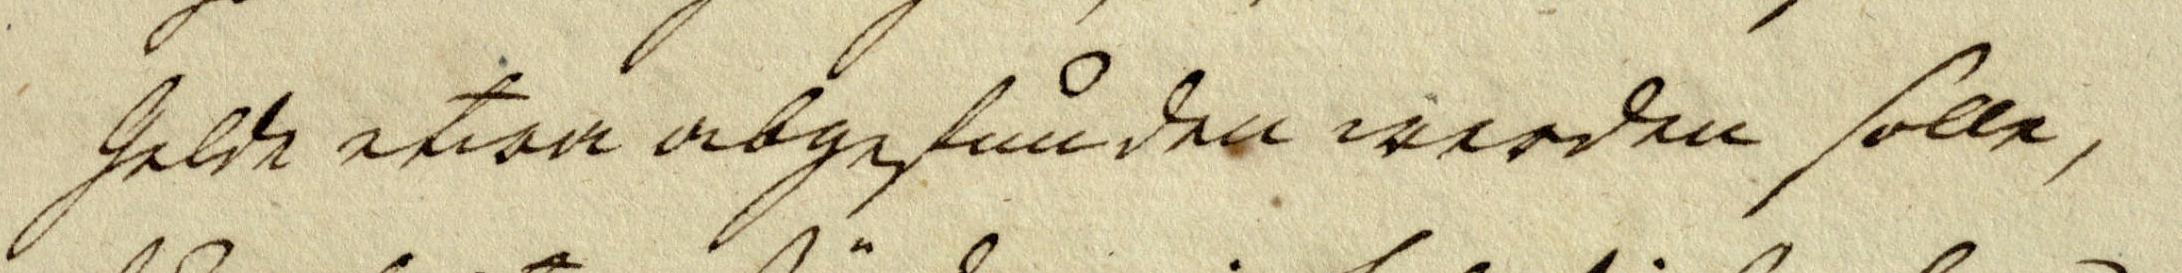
Gelde etwa abgefunden werden solle,
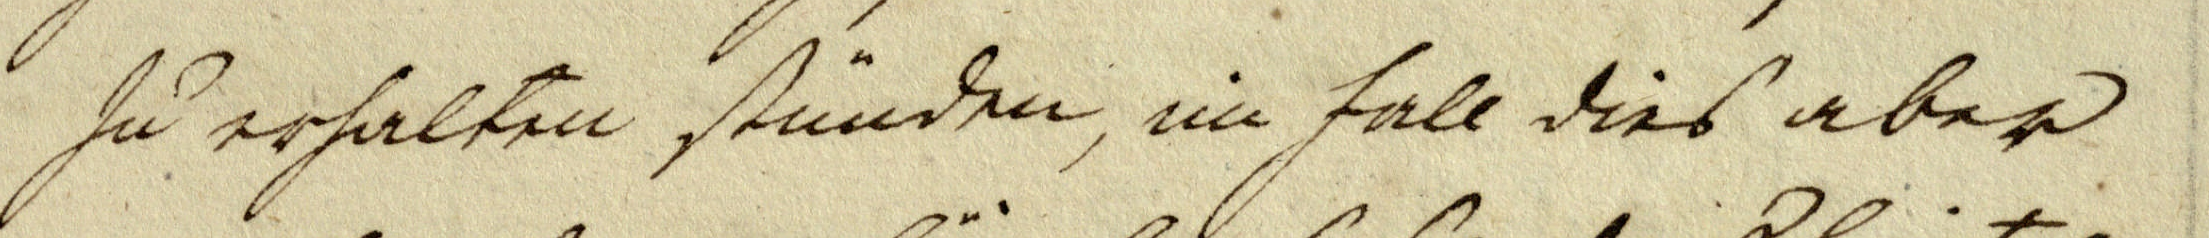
zu erhalten stünden, im Fall dies aber
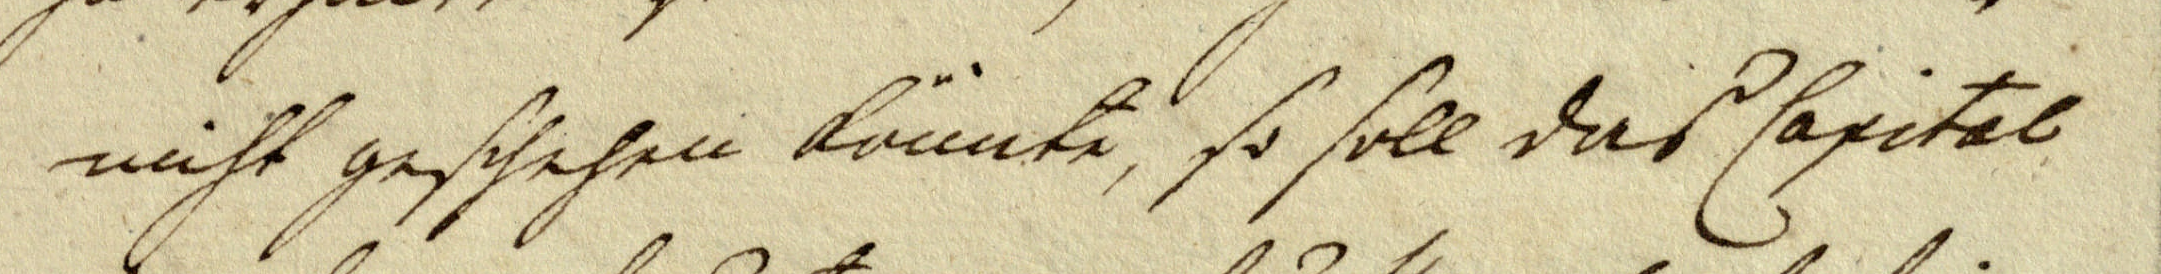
nicht geschehen könnte, so soll das Capital
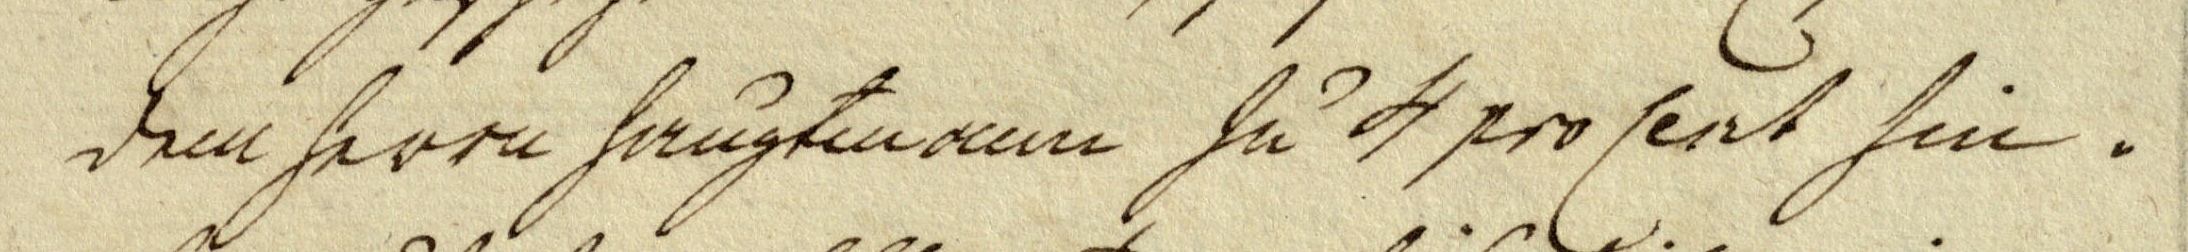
dem Herrn Hauptmann zu 4 pro Cent Zin¬
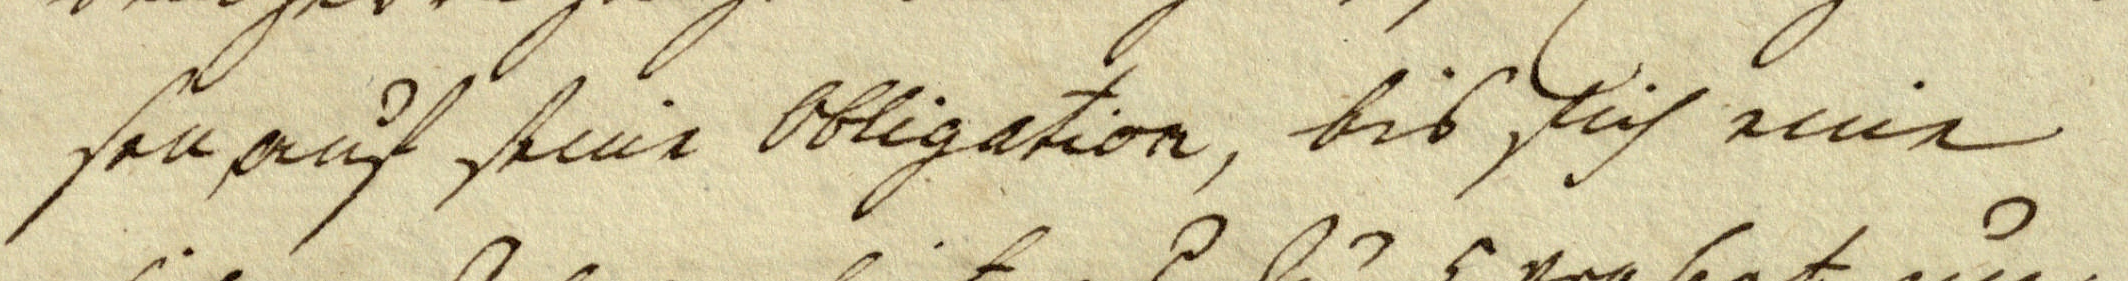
sen auf seine Obligation, bis sich eine
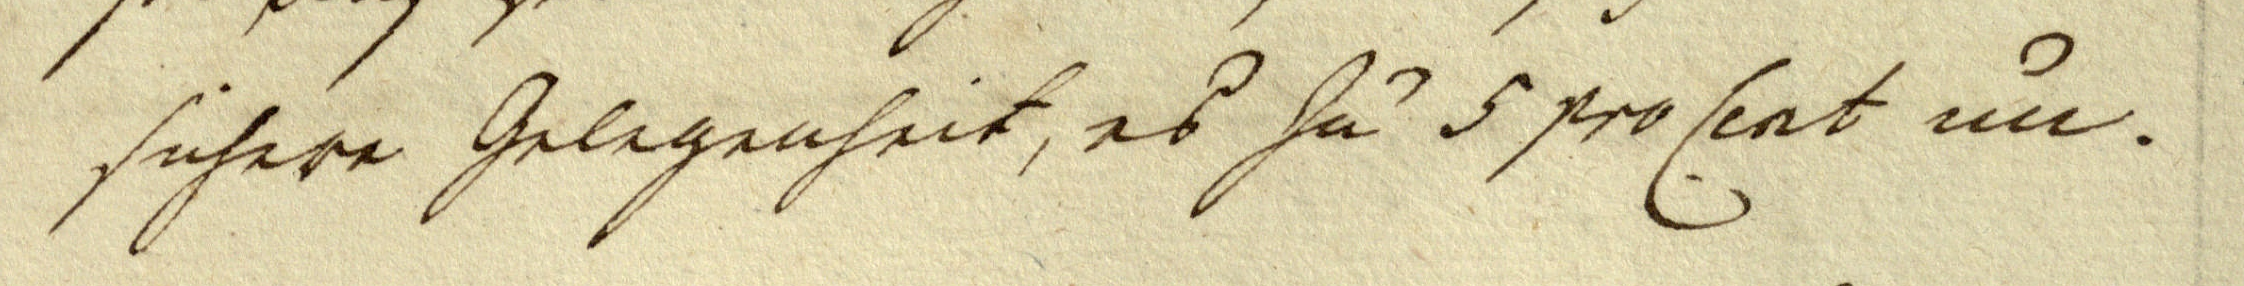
sichere Gelegenheit, es zu 5 pro Cent un¬
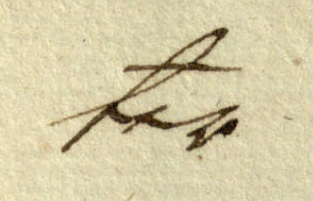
ter
